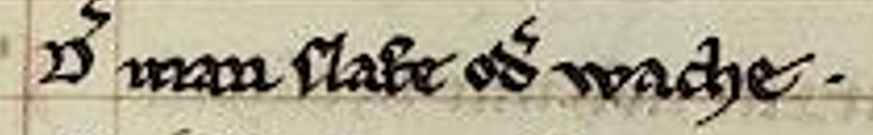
D(er) man ſlafe od(er) wache.
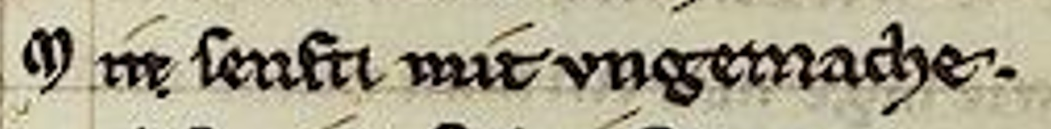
Mitt ſenfti mit vngemache.
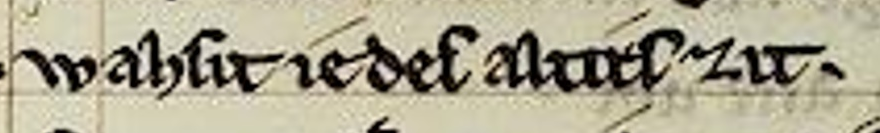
Wahſit ie deſ altirſ zit.
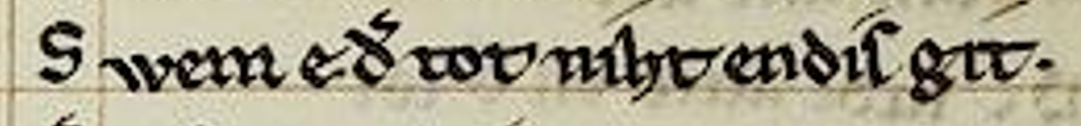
Swem e d(er) tot niht endiſ git.
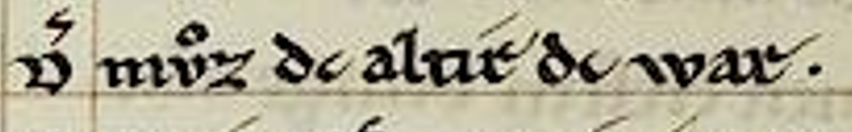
D(er) mv°oz d(az) altir d(az) war.
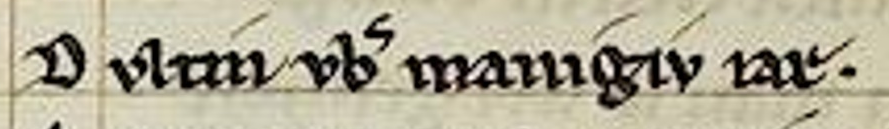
Dvltin vb(er) manigiv iar.
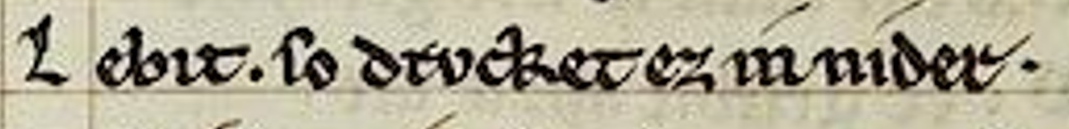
Lebit. ſo drvcket ez in nider.
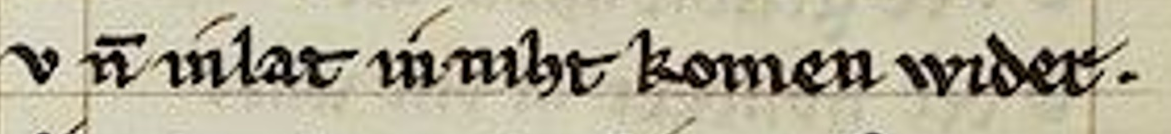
Vn(d) inlat in niht komen wider.
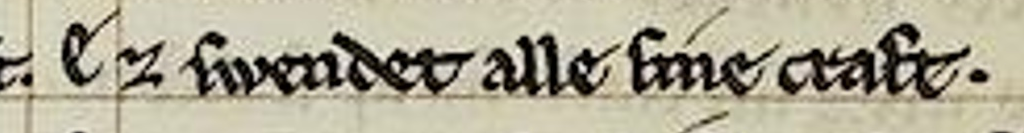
Ez ſwendet alle ſine craft.
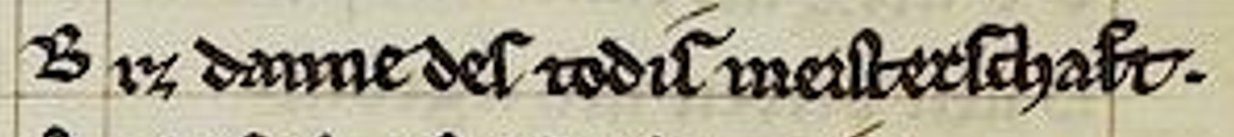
Biz danne deſ todiſ meiſterſchaft.
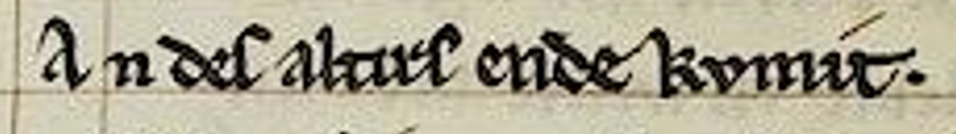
An deſ altirſ ende kvmit.
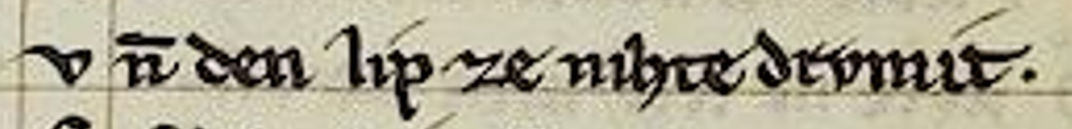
Vn(d) den lip ze nihte drvmit.
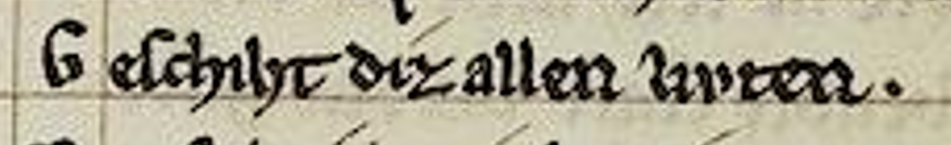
Geſchiht diz allen livten.
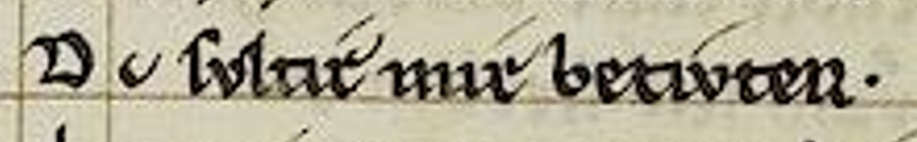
D(az) ſvltir mir betivten.
